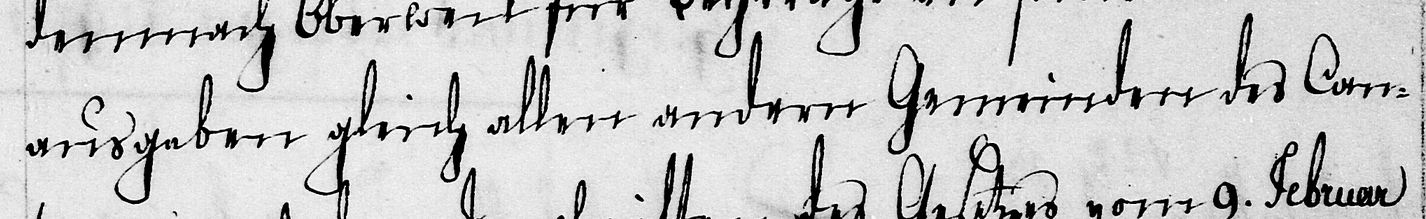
ausgaben gleich allen andern Gemeinden des Can¬
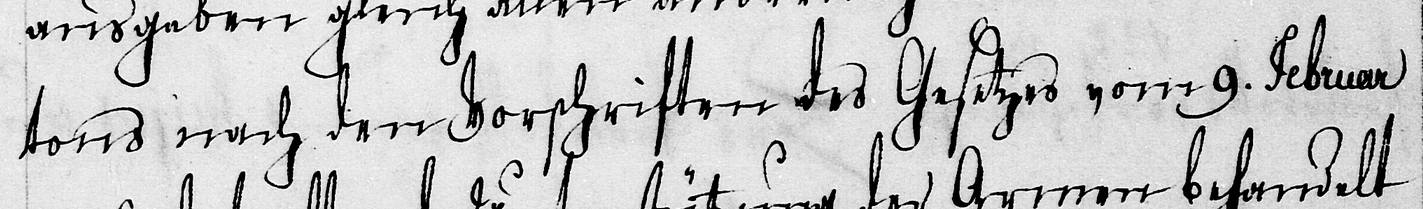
tons nach den Vorschriften des Gesetzes vom 9. Februar
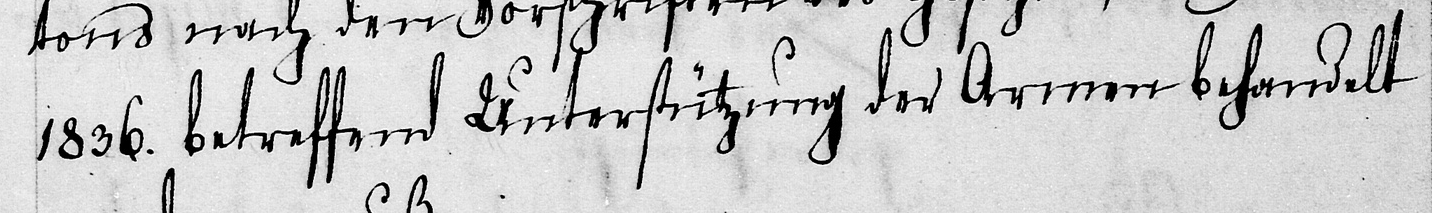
1836. betreffend Unterstützung der Armen behandelt
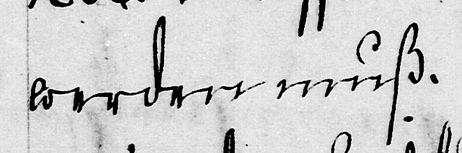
werden muß.
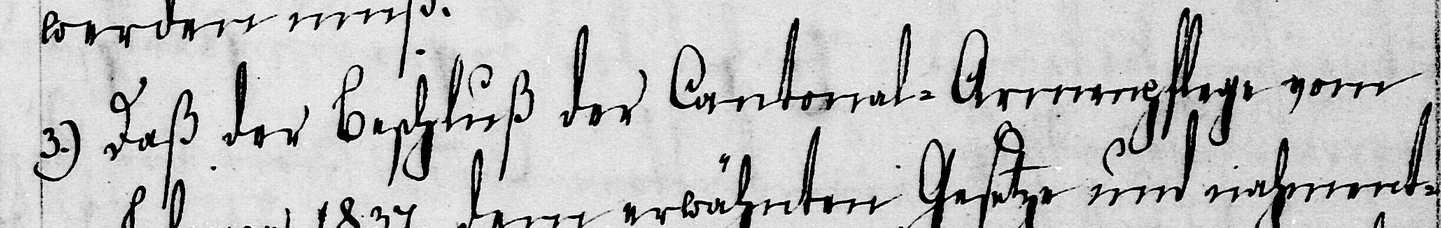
3.) Daß der Beschluß der Cantonal-Armenpflege vom
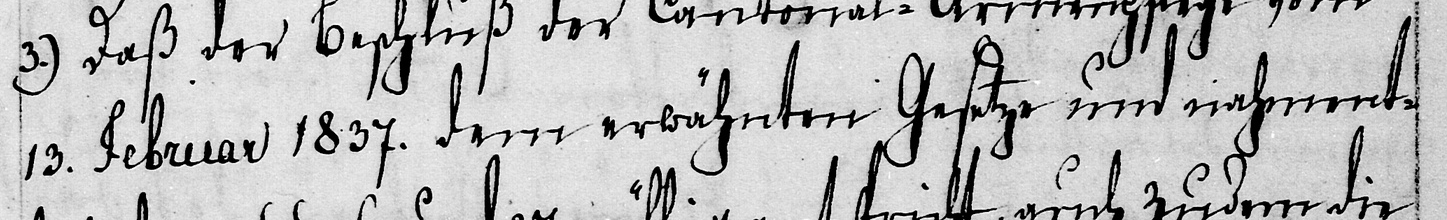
13. Februar 1837. dem erwähnten Gesetze und nahment¬
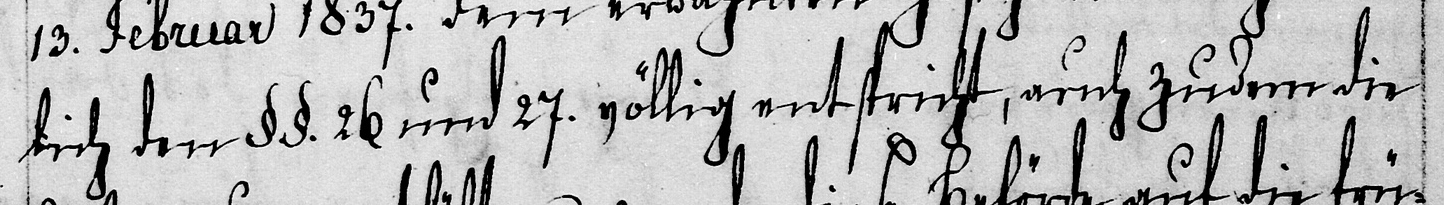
lich den §§. 26. und 27. völlig entspricht, auch zudem die
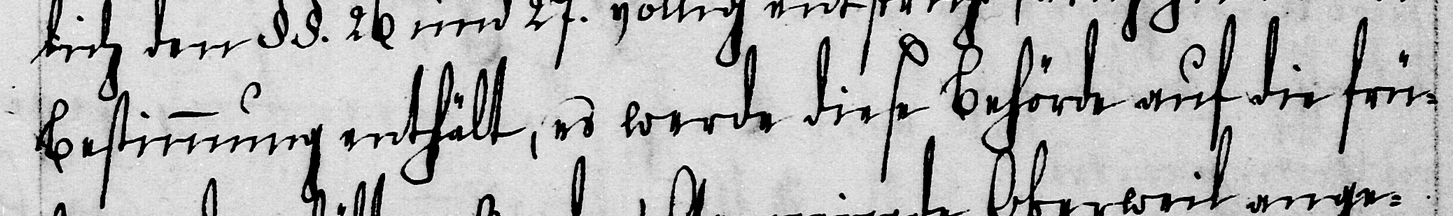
Bestimmung enthält, es werde diese Behörde auf die frü¬
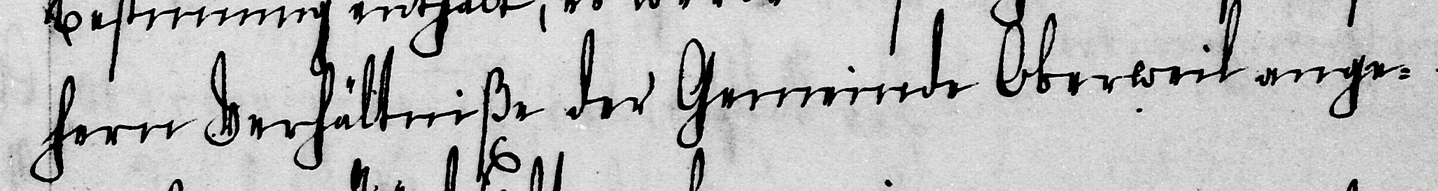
hern Verhältniße der Gemeinde Oberweil ange¬
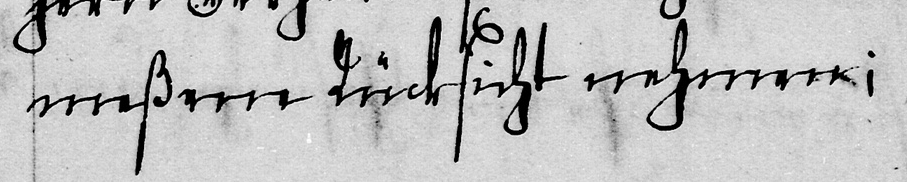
meßene Rücksicht nehmen;
